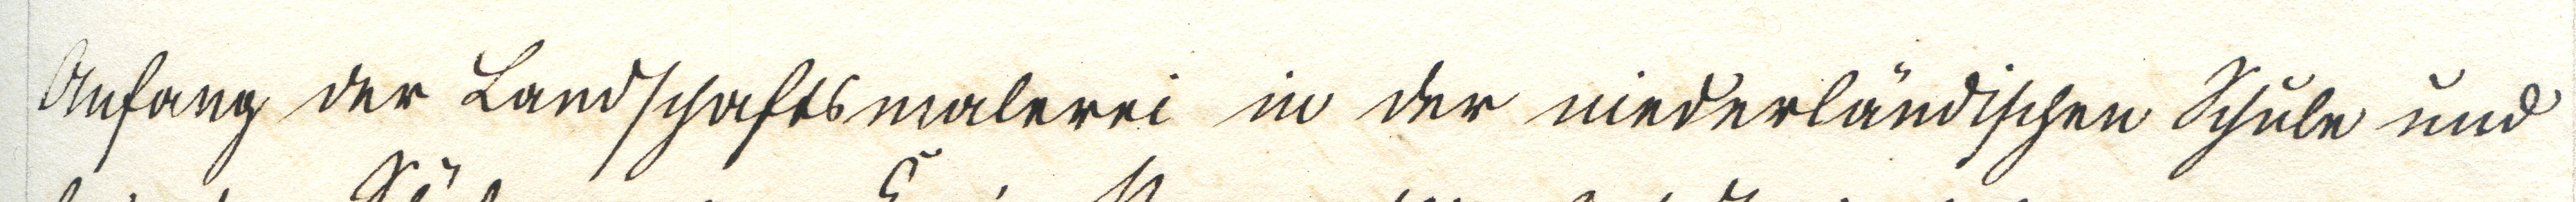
Anfang der Landschaftsmalerei in der niederländischen Schule und
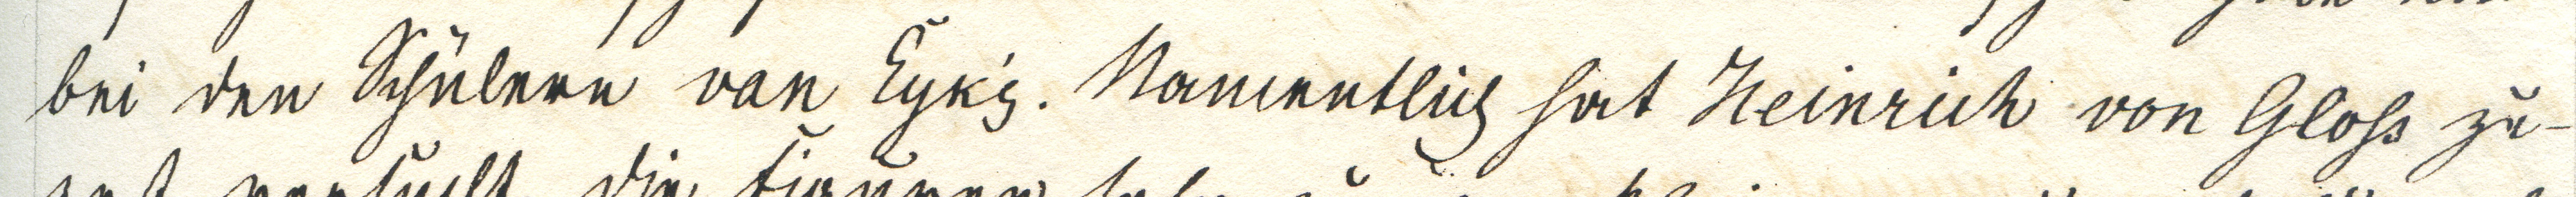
bei den Schülern van Eyk’s. Namentlich hat Heinrich von Gloss zu-
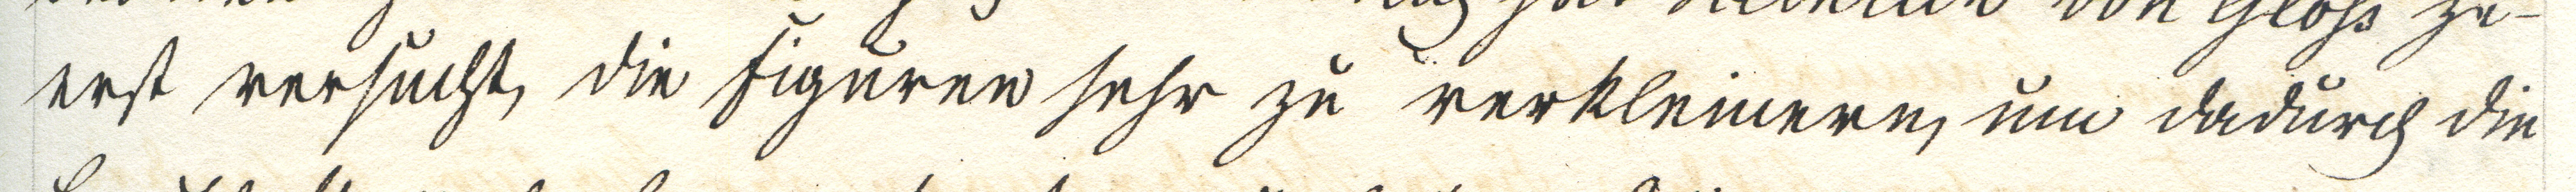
erst versucht, die Figuren sehr zu verkleinern, um dadurch die
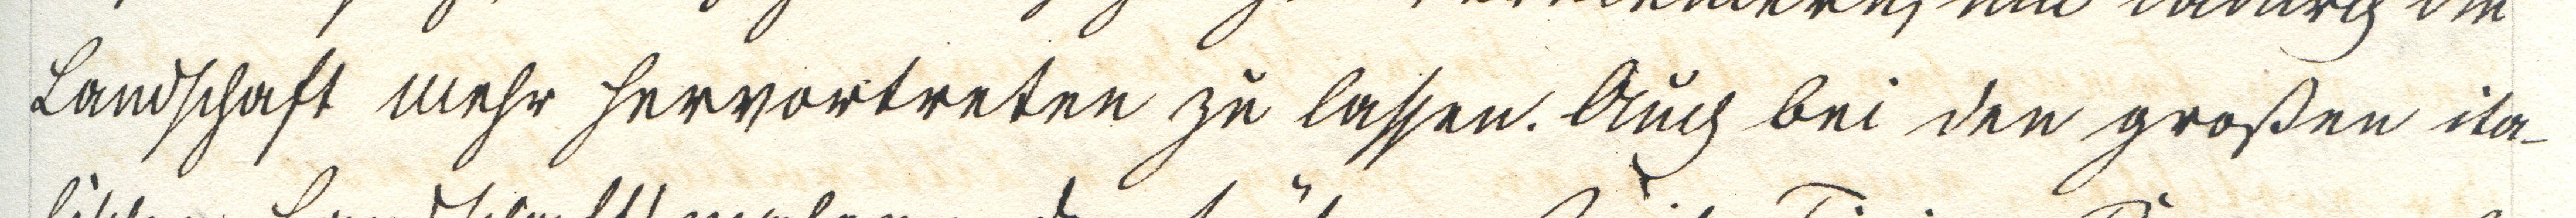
Landschaft mehr hervortreten zu lassen. Auch bei den großen ita-
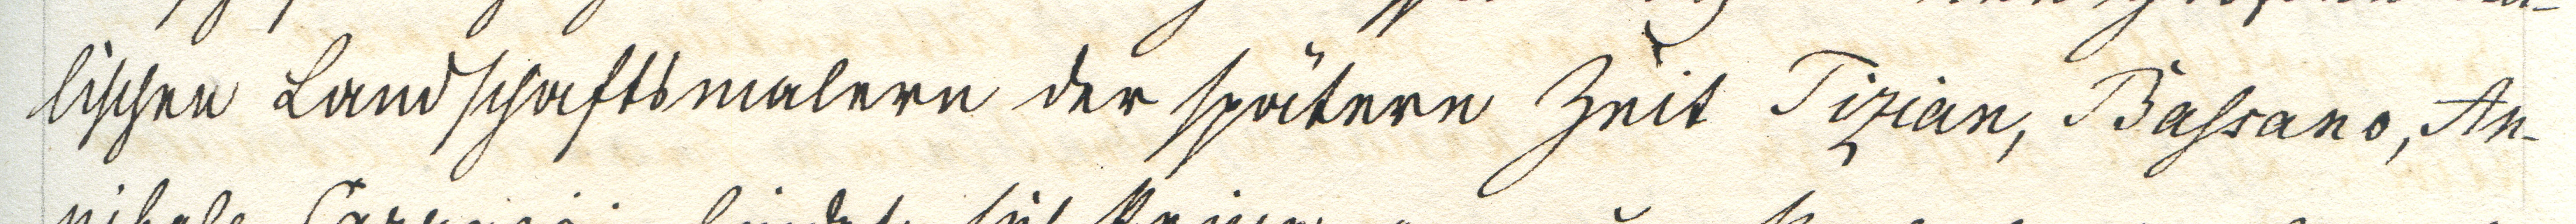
lischen Landschaftsmalern der spätern Zeit Tizian, Bassano, An-
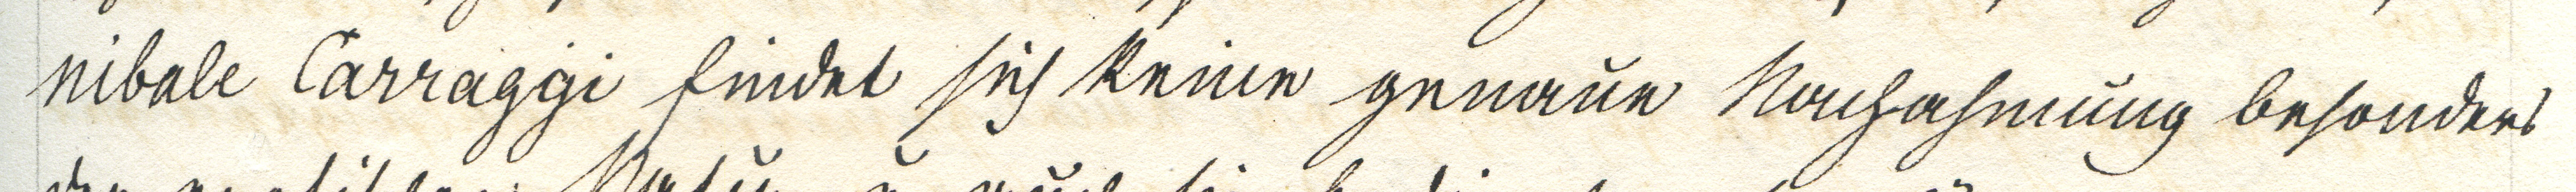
nibale Carraggi findet sich keine genaue Nachahmung besonders
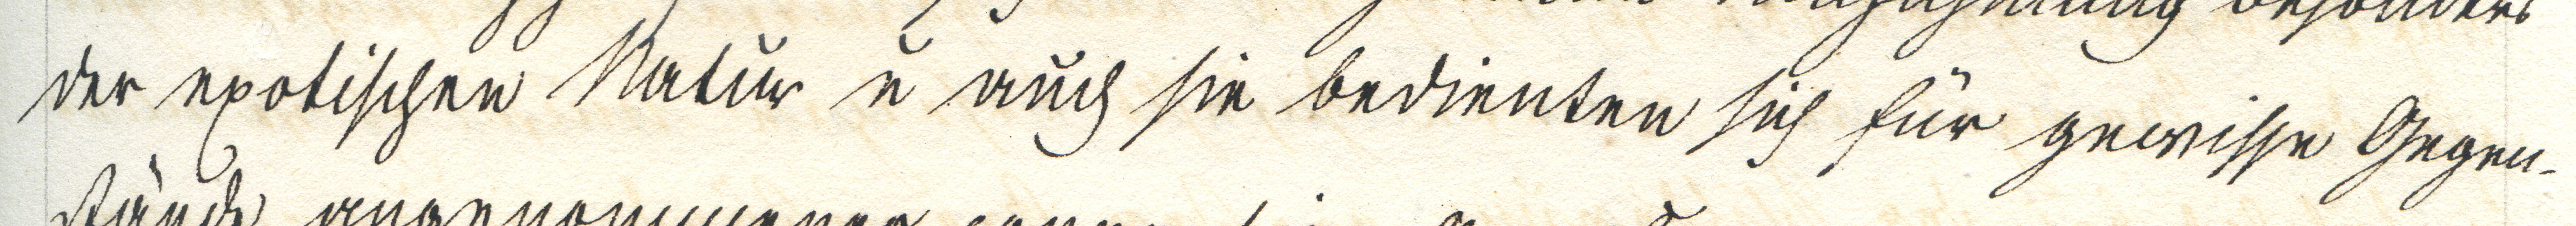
der exotischen Natur u auch sie bedienten sich für gewisse Gegen-
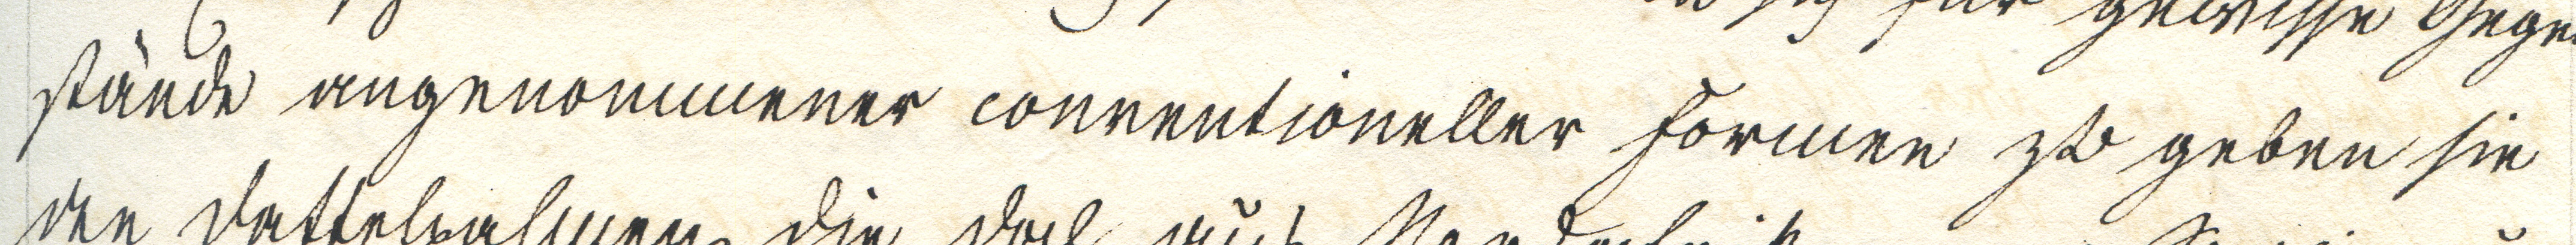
stände angenommener conventioneller Formen zB geben sie
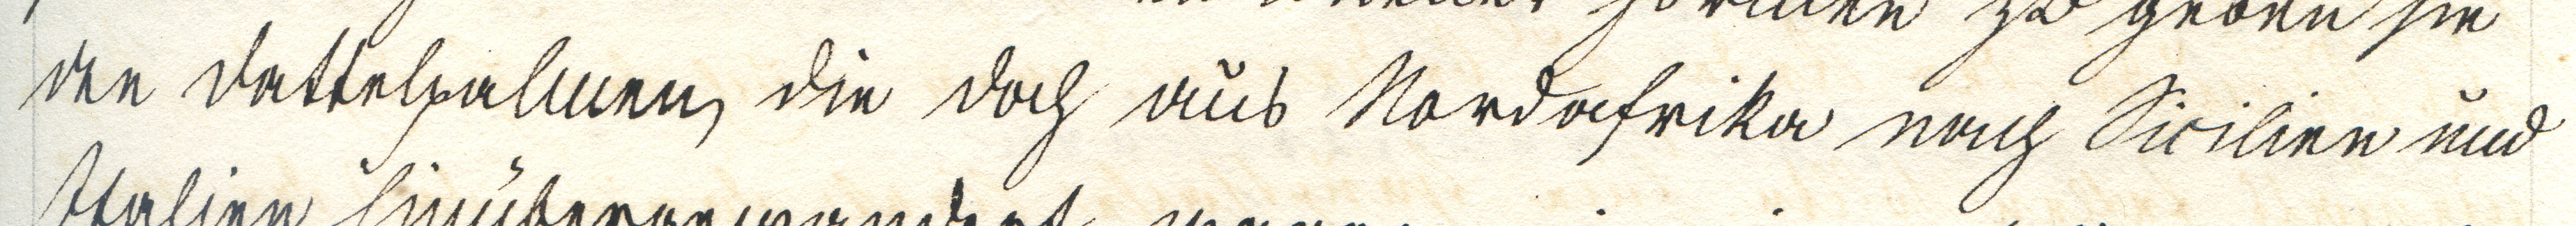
den Dattelpalmen, die doch aus Nordafrika nach Sicilien und
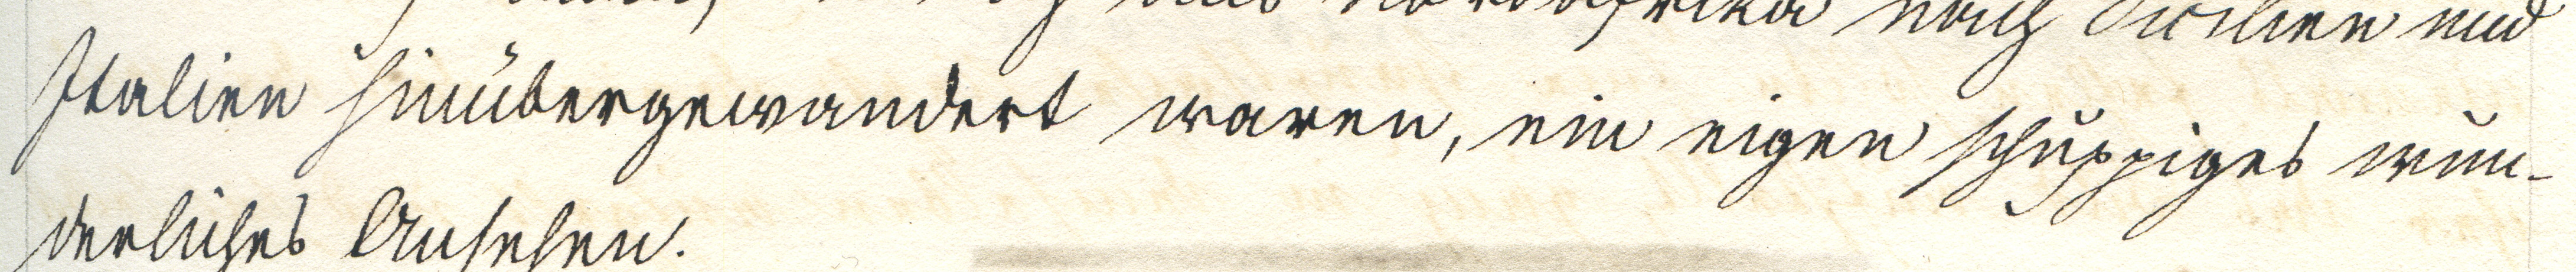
Italien hinübergewandert waren, ein eigen schuppiges wun-
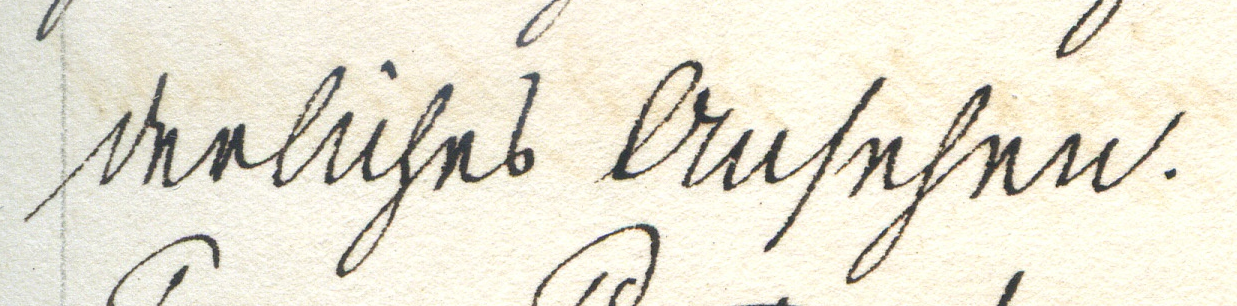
derliches Ansehen.
